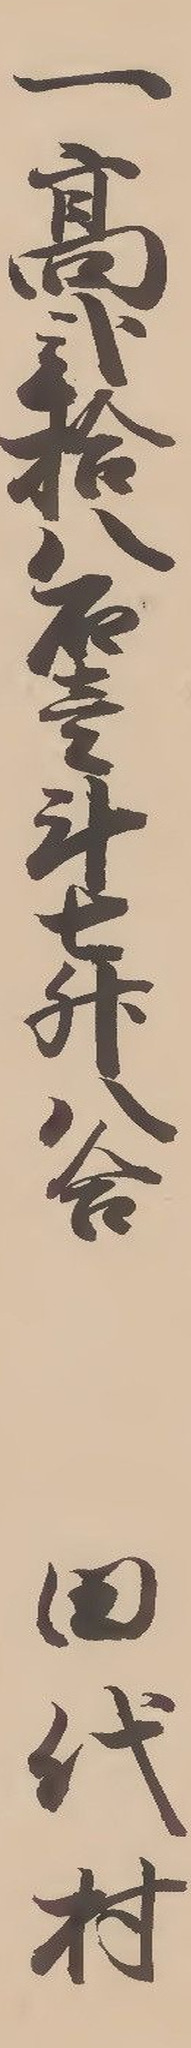一高弐拾八石壱斗七升八合田代村
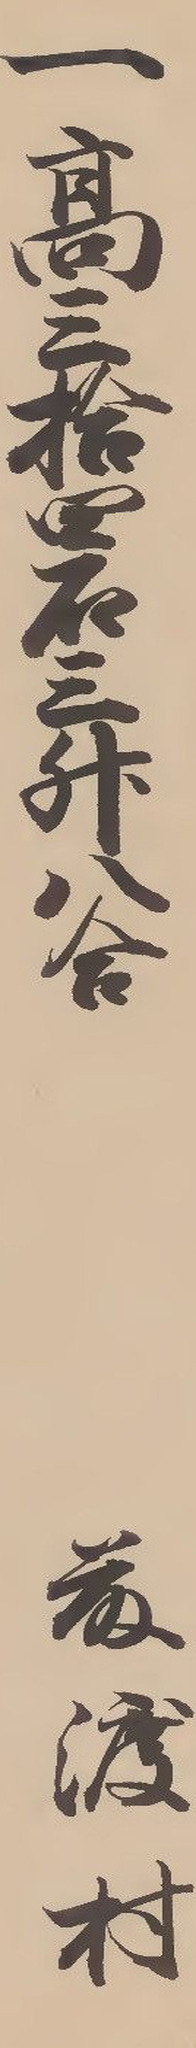一高三拾四石三升八合藤渡村
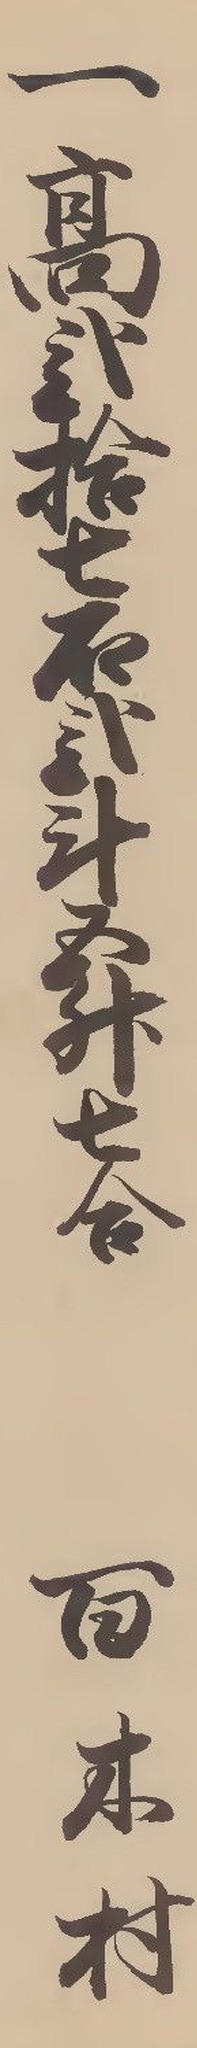一高弐拾七石弐斗五升七合百木村
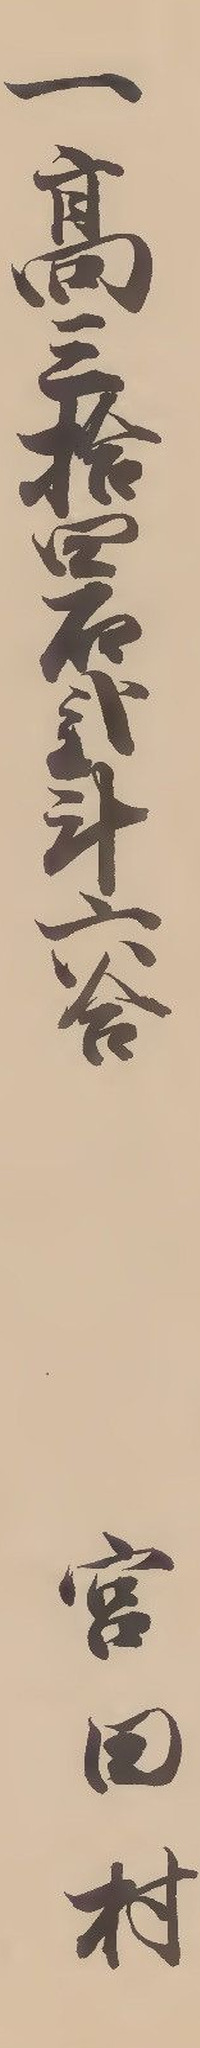一高三拾四石弐斗六合宮田村
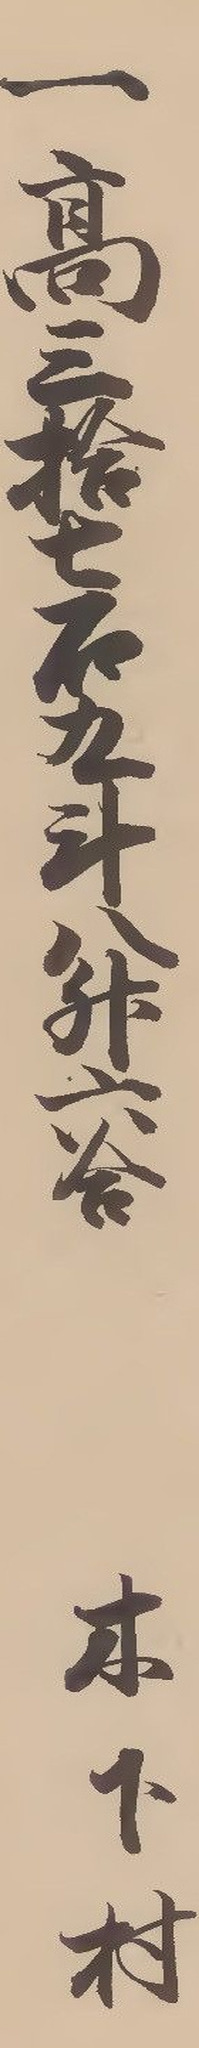一高三拾七石九斗八升六合木下村

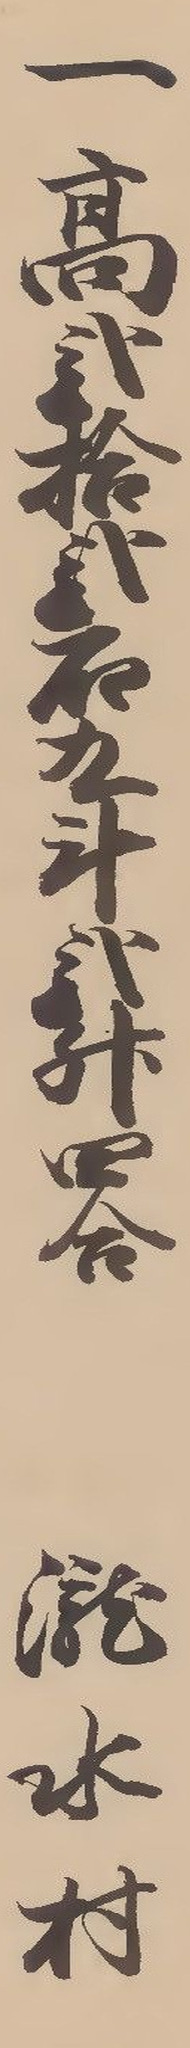一高弐拾弐石九斗弐升四合滝水村
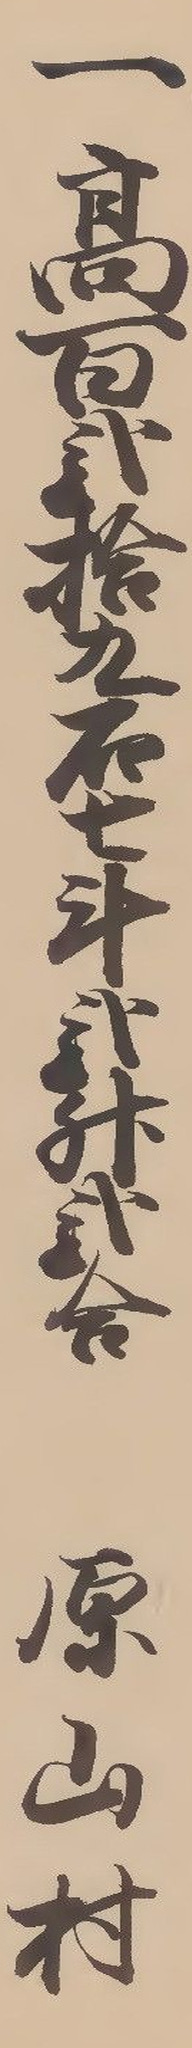一高百弐拾九石七斗弐升弐合原山村
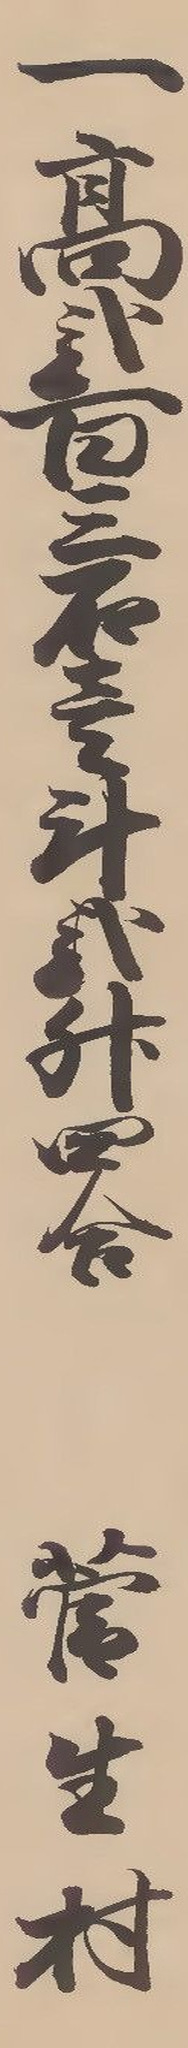一高弐百三石壱斗弐升四合菅生村
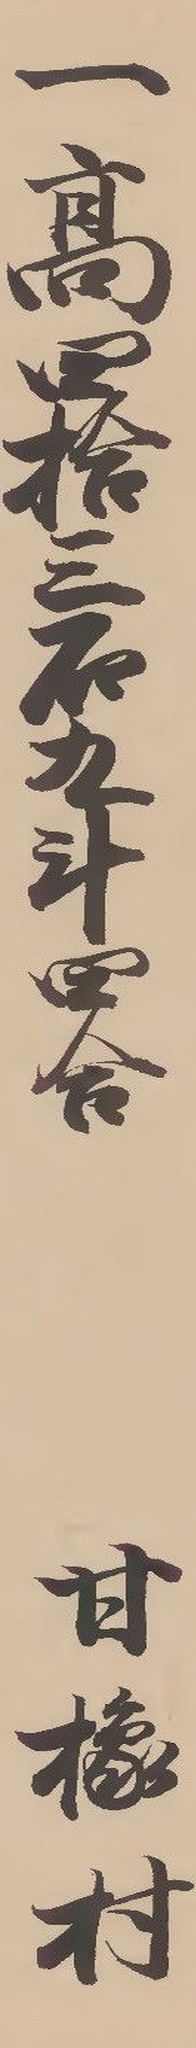一高四拾三石九斗四合甘橡村
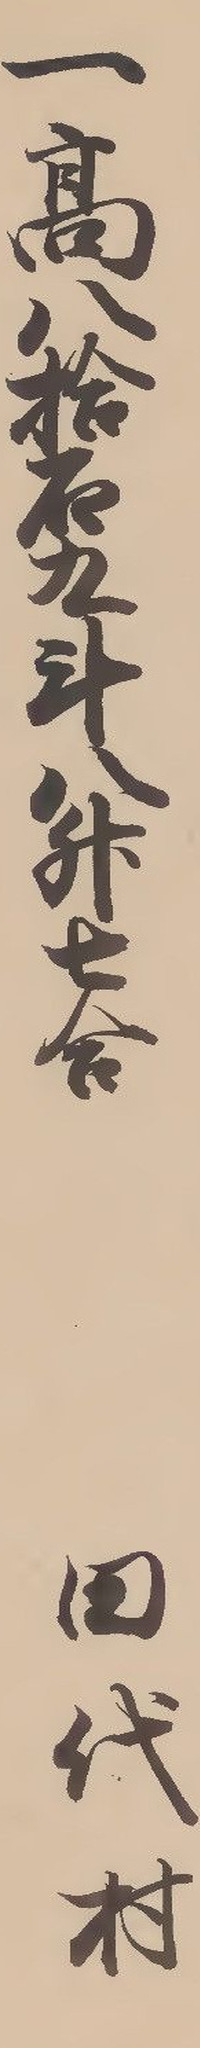一高八拾石九斗八升七合田代村
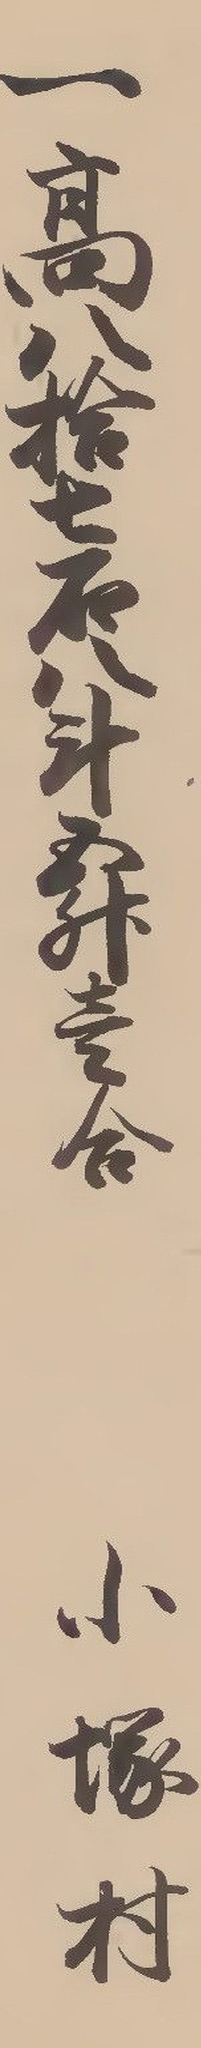一高八拾七石八斗五升壱合小塚村
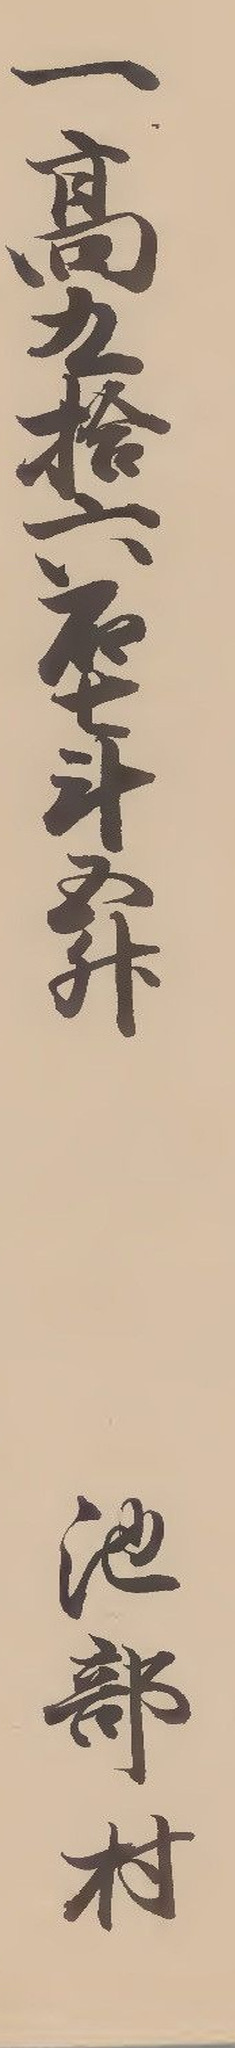一高九拾六石七斗五升池部村
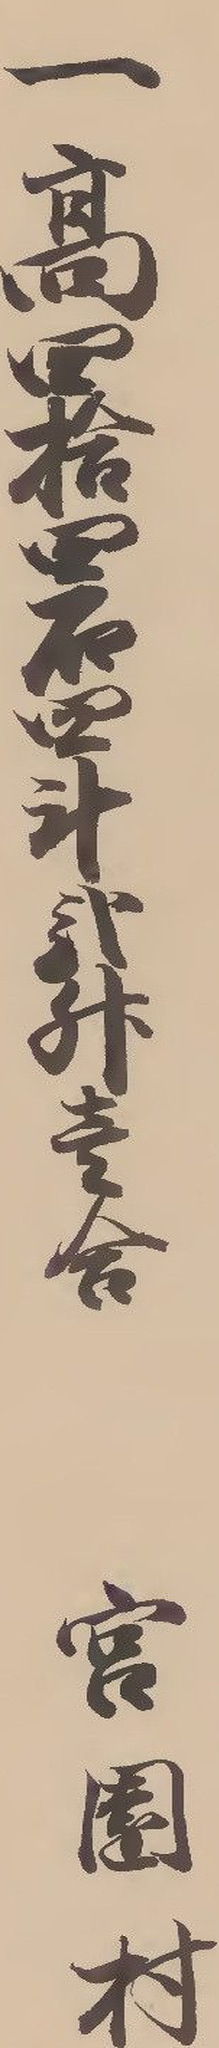一高四拾四石四斗弐升壱合宮園村

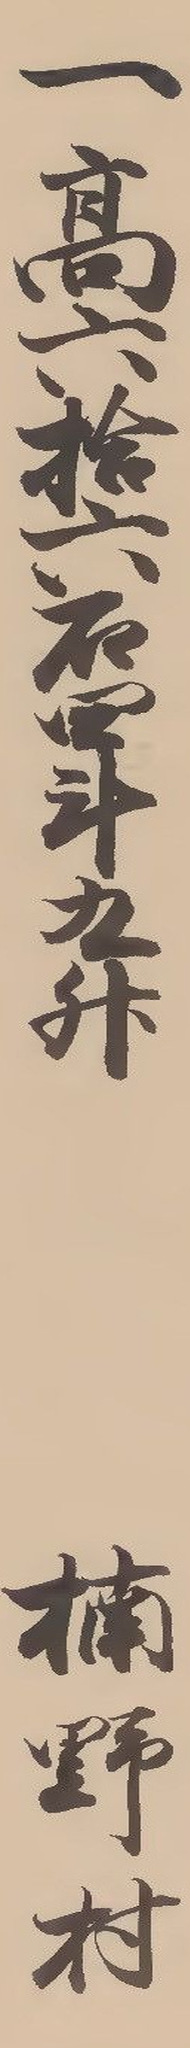一高六拾六石四斗九升楠野村
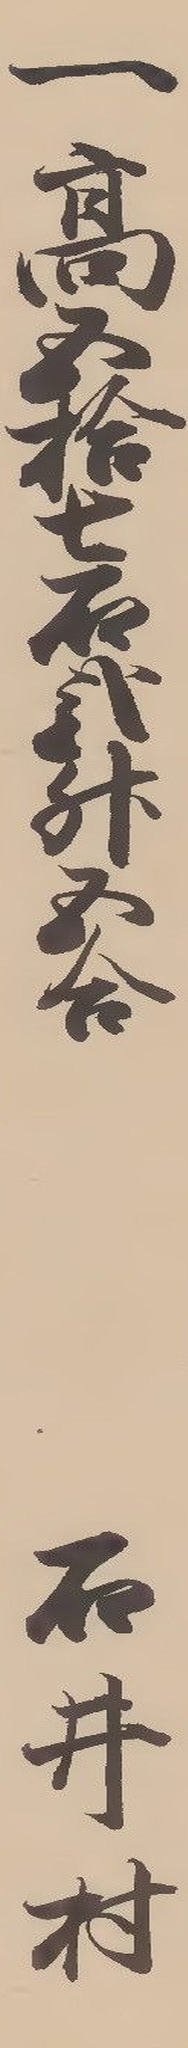一高五拾七石弐升五合石井村
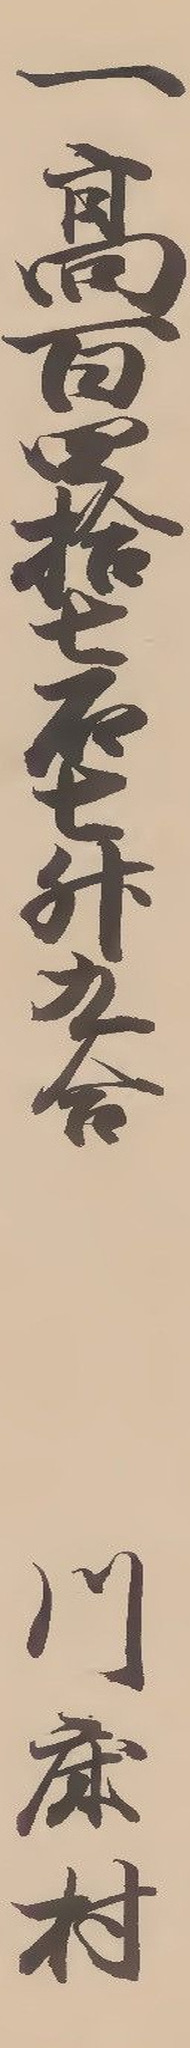一高百四拾七石七升九合川床村
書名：豊後国郷帳
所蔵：国立公文書館 National Archives of Japan
